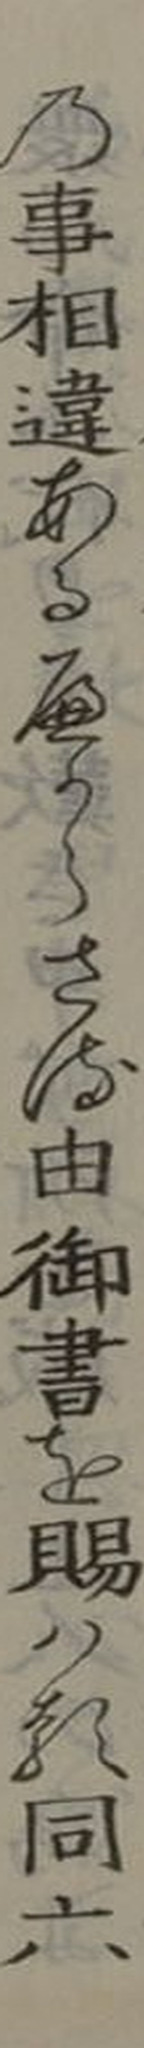の事相遺あるへからさる由御書を賜はる同六
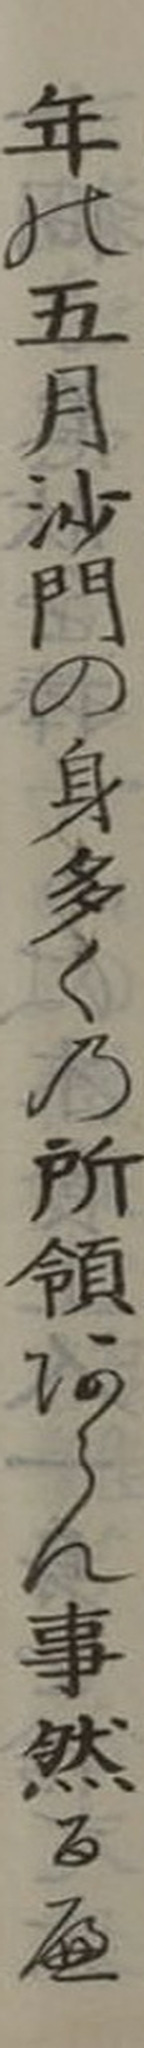年の五月沙門の身多くの所領あらん事然るへ
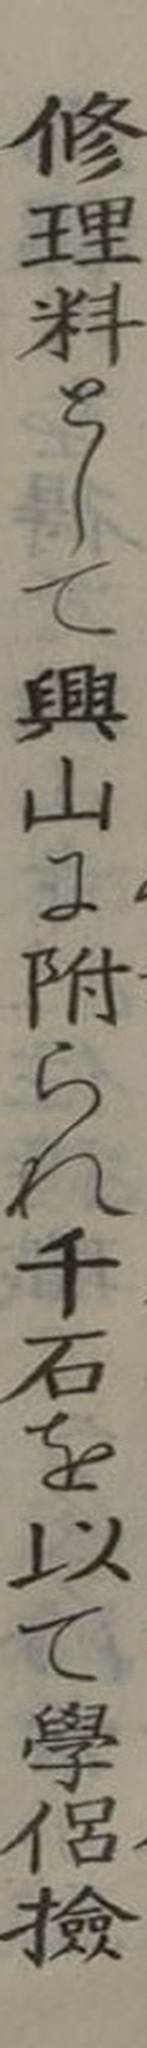修理料として興山に附られ千石を以て學侶撿
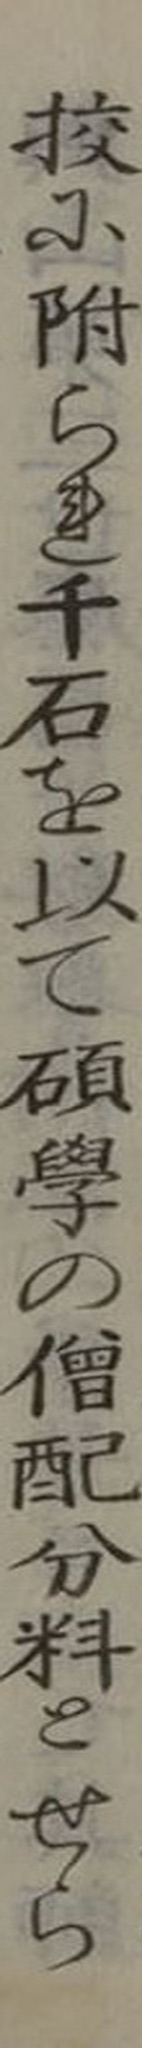校に附られ千石を以て碩學の僧配分料とせら
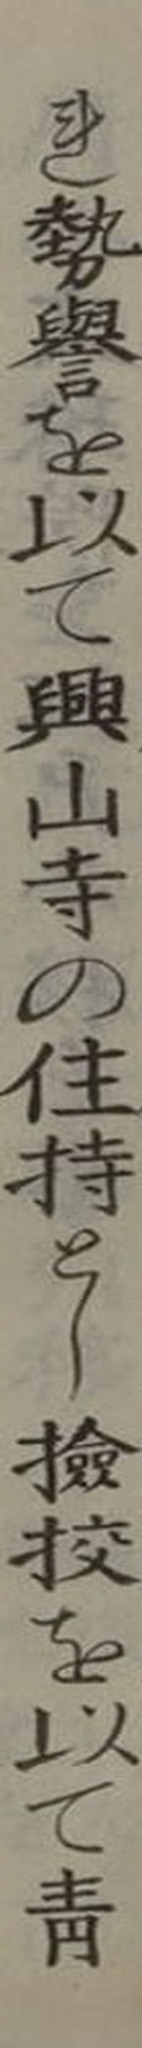れ勢譽を以て興山寺の住持とし撿校を以て靑
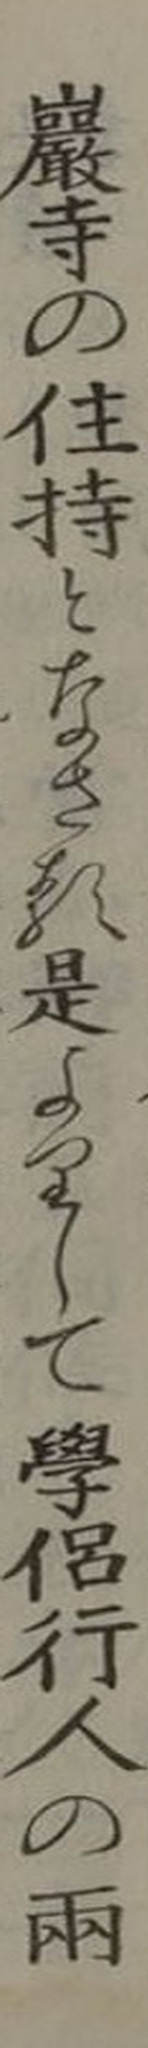嚴寺の住持となさる是よりして學侶行人の兩
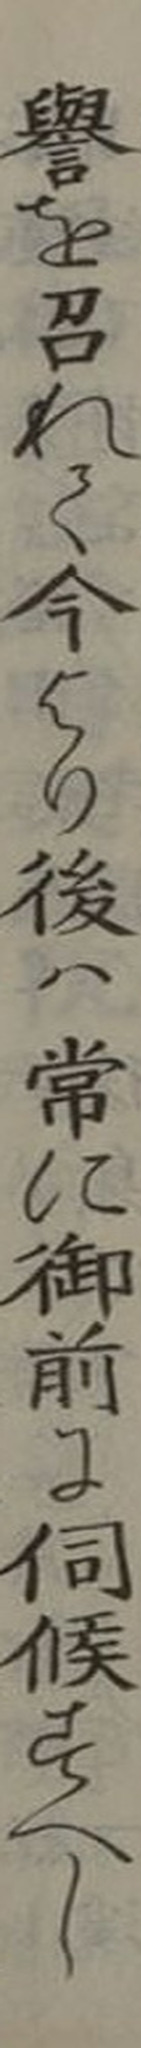譽を召れて今より後は常に御前に伺候すへし
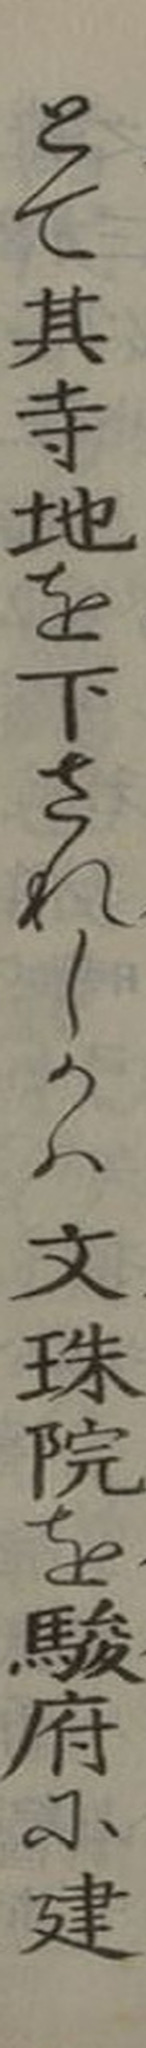とて其寺地を下されしかは文珠院を駿府に建
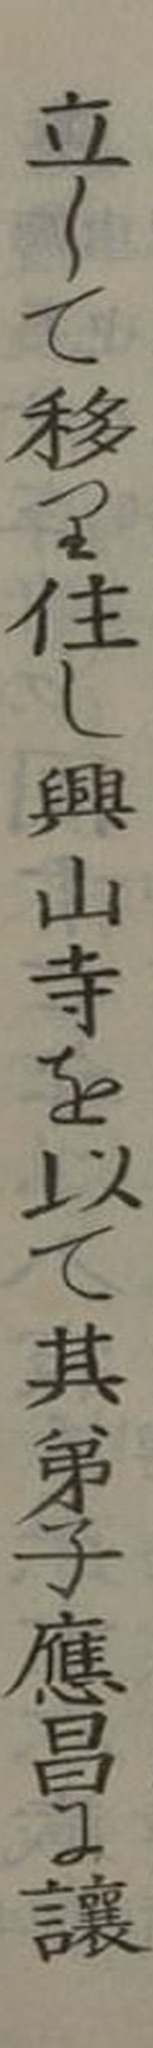立して移り住し興山寺を以て其弟子應昌に讓

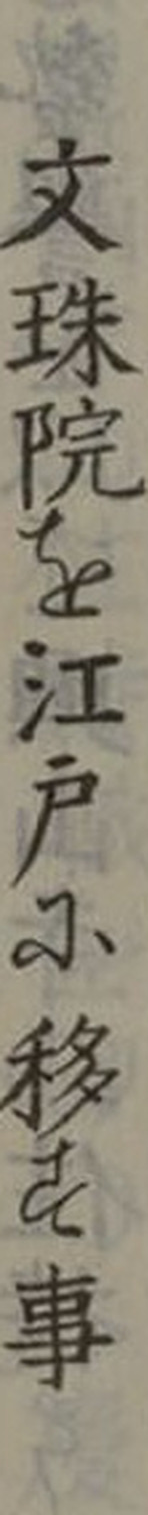文珠院を江戸に移す事
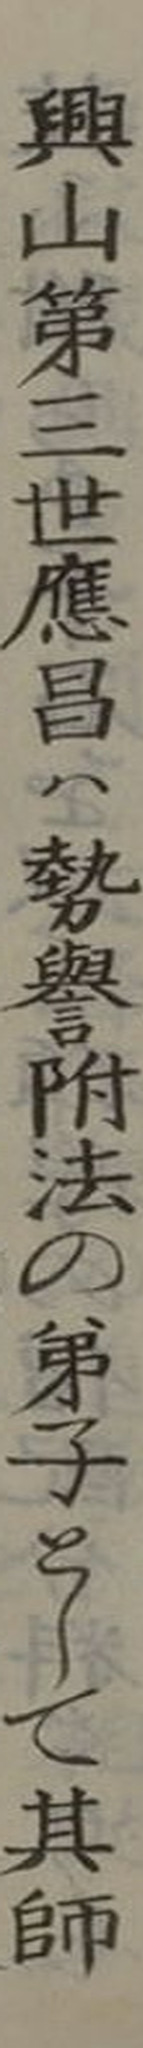興山第三世應昌は勢譽附法の第子として其師
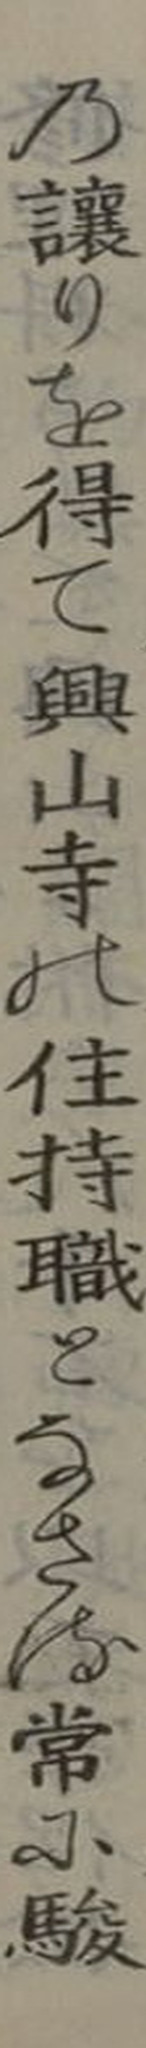の讓りを得て興山寺の住持職となされ常に駿
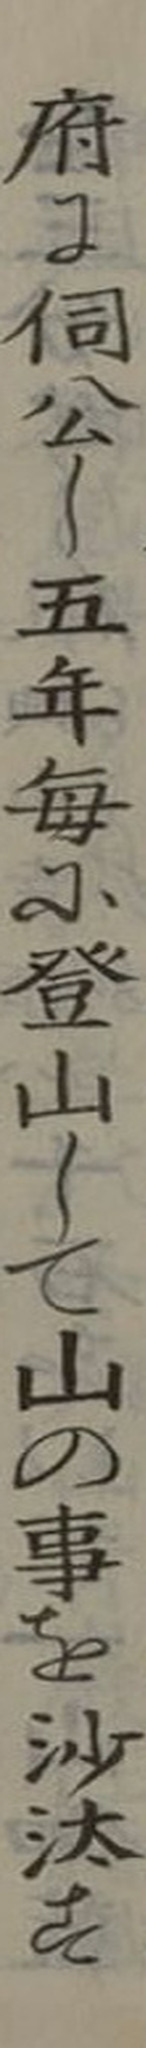府に伺公し五年每に登山して山の事を沙汰す
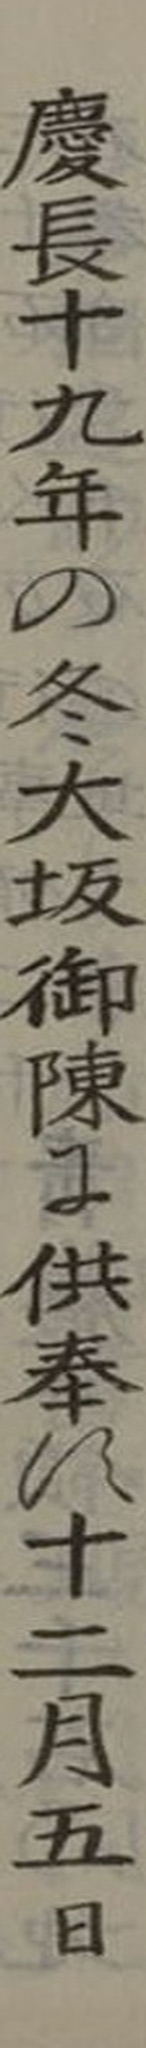慶長十九年の冬大坂御陳に供奉す十二月五日
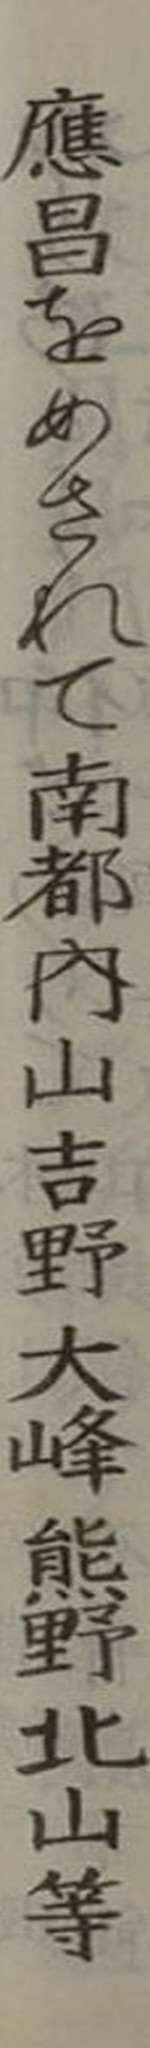應昌をめされて南都内山吉野大峰熊野北山等
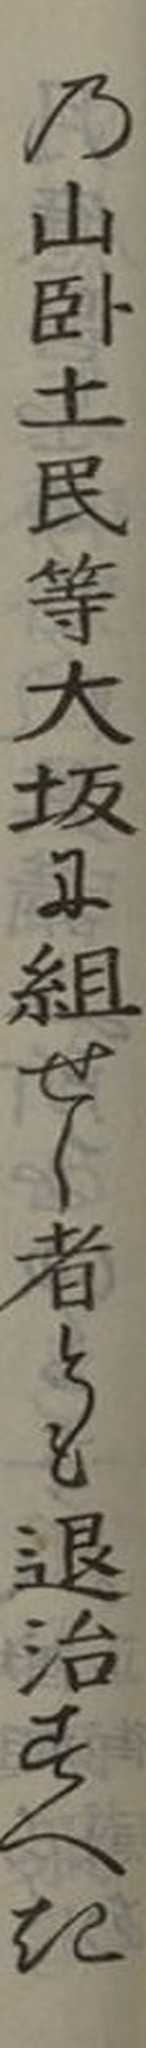の山卧土民等大坂に組せし者とも退治すへき
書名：骨董録
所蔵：University of the Ryukyus Library
